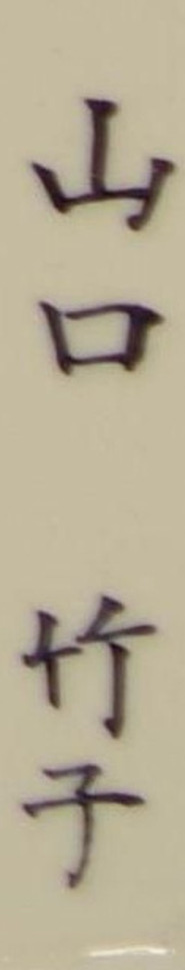山口竹子
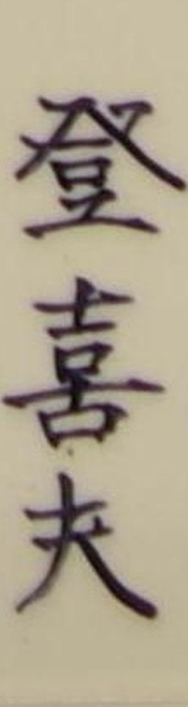登喜夫
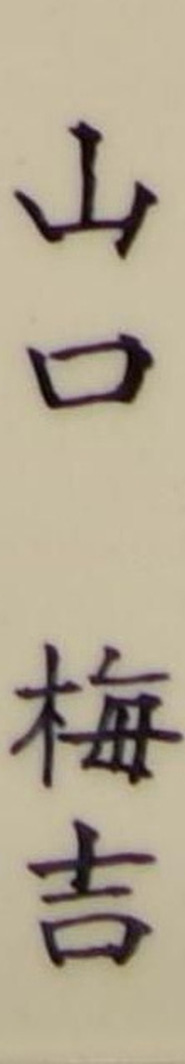山口梅吉
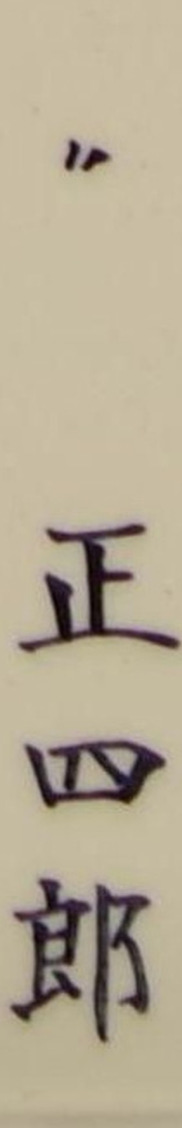正四郎
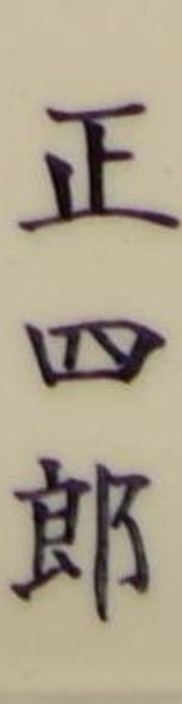正四郎
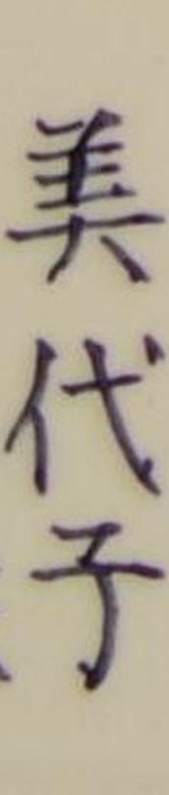美代子

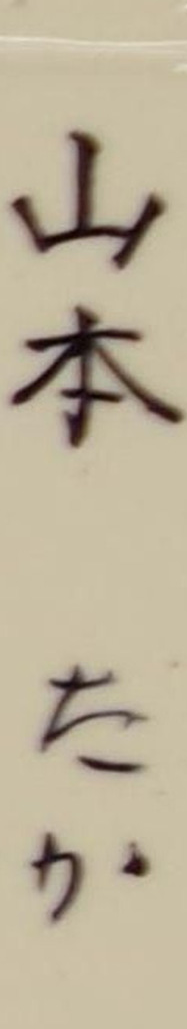山本たか
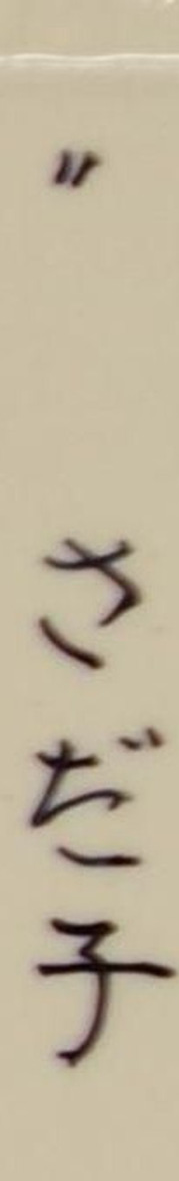さだ子
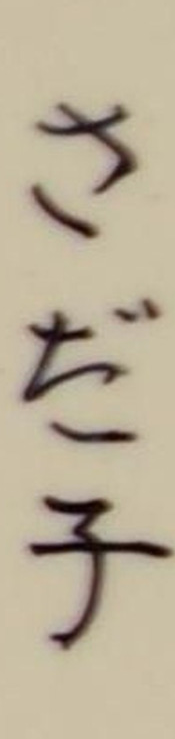さだ子
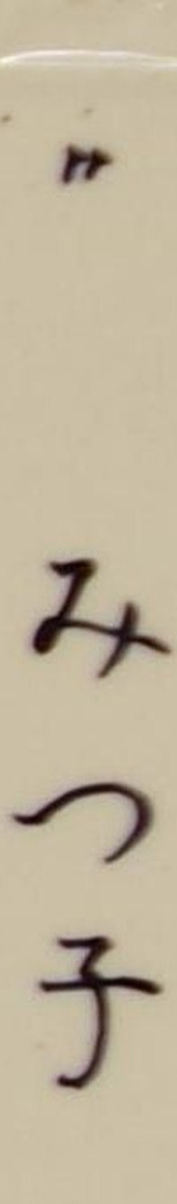みつ子
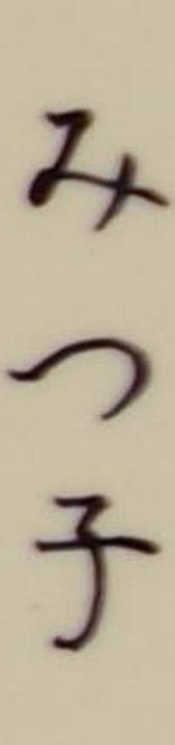みつ子
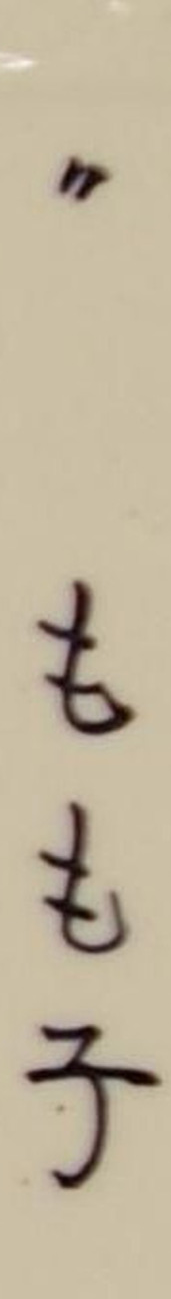もも子
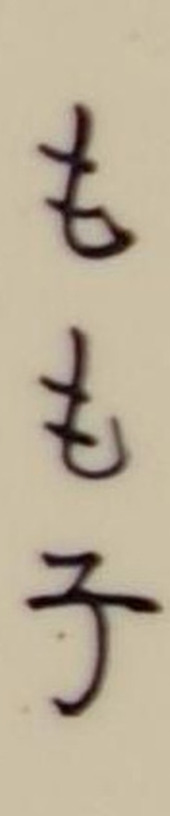もも子
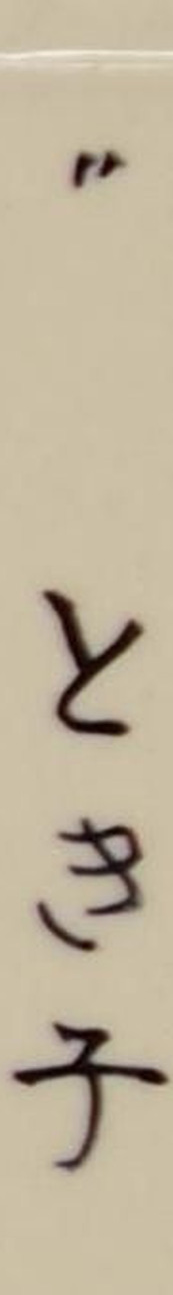とき子
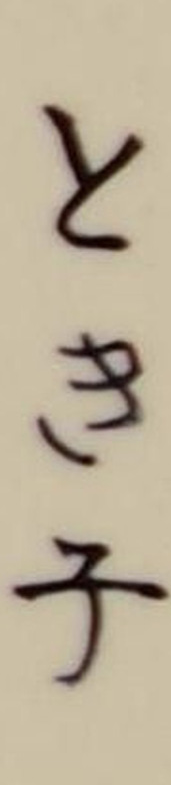とき子
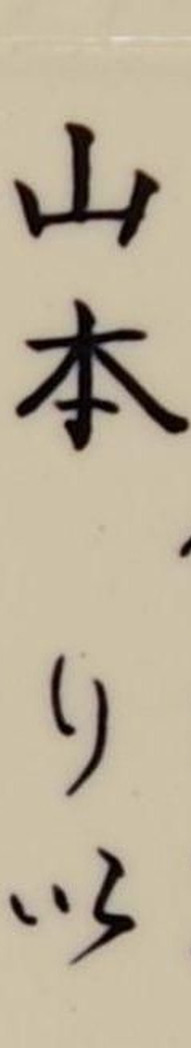山本りい
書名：A~D
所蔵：koyasan kongobuji
